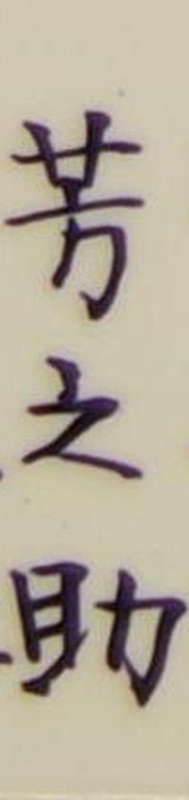芳之助
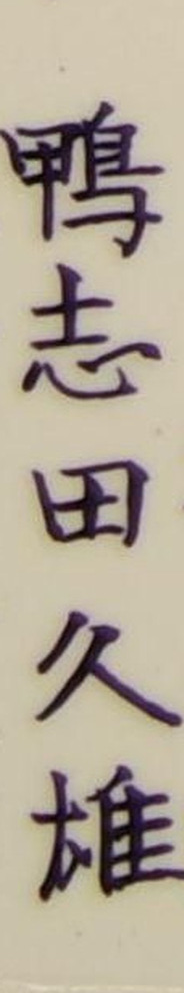鴨志田久雄
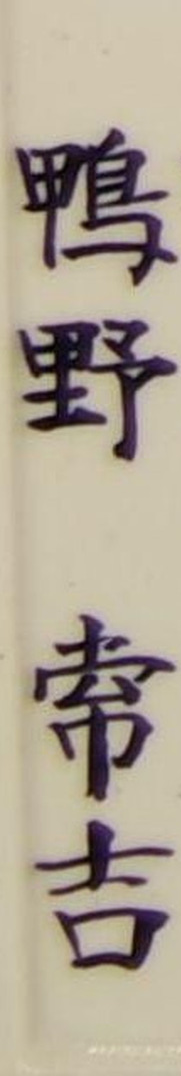鴨野常吉

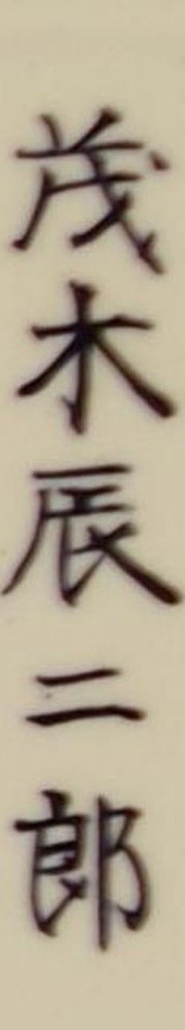茂木辰二郎
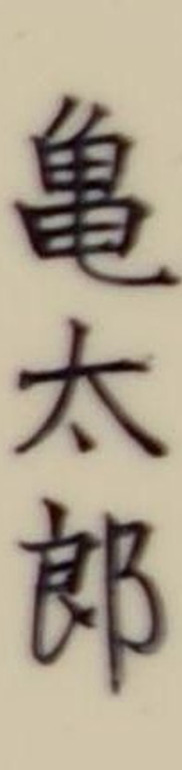亀太郎
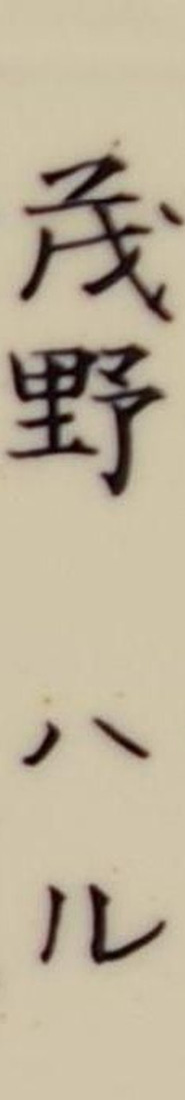茂野ハル
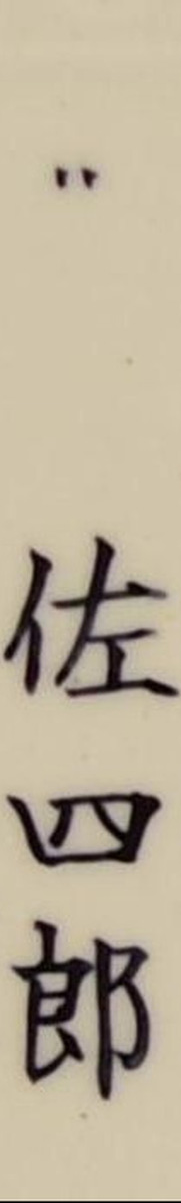佐四郎
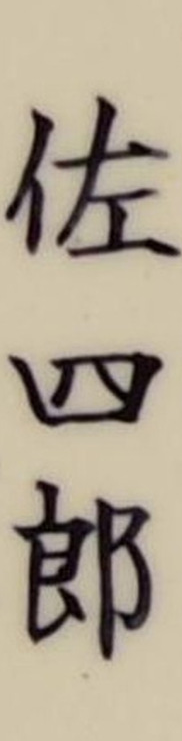佐四郎
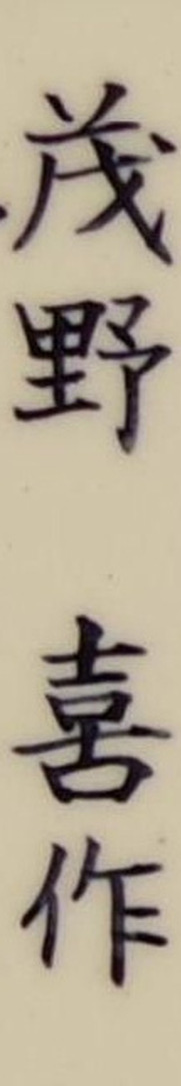茂野喜作
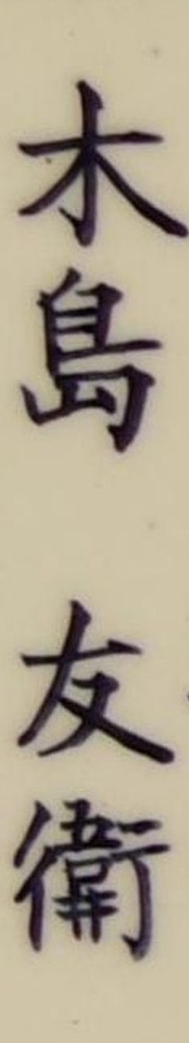木島友衛
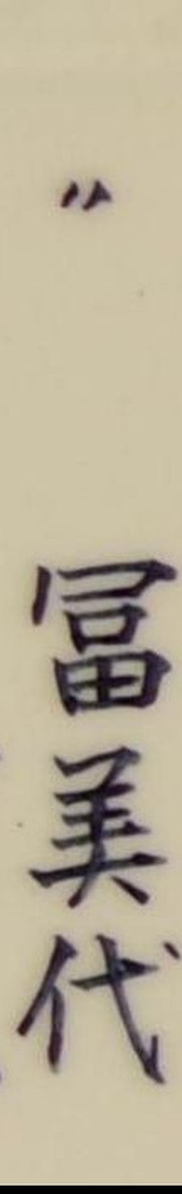冨美代
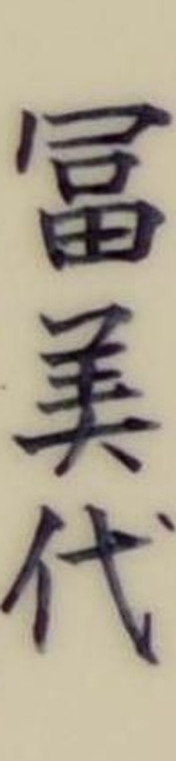冨美代

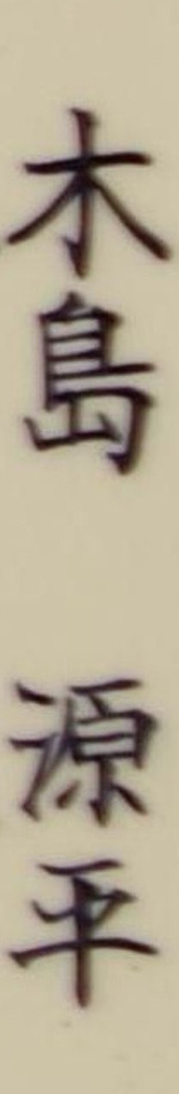木島源平
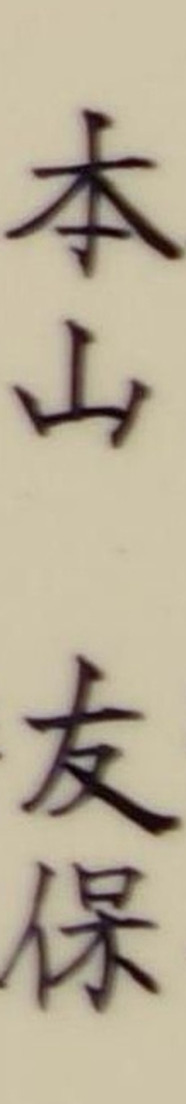本山友保
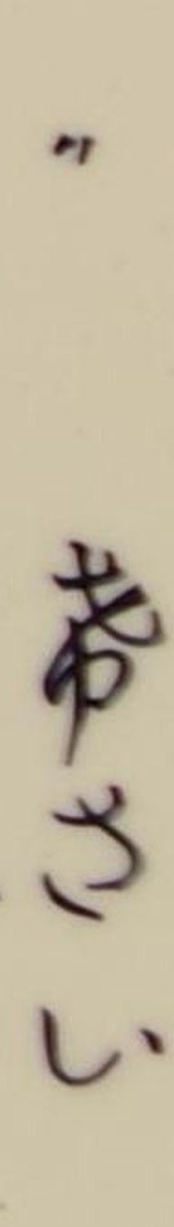けさい
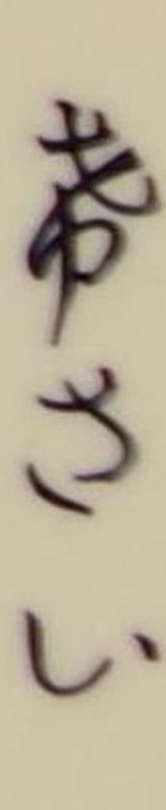けさい
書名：E~L
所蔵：高野山金剛峯寺
